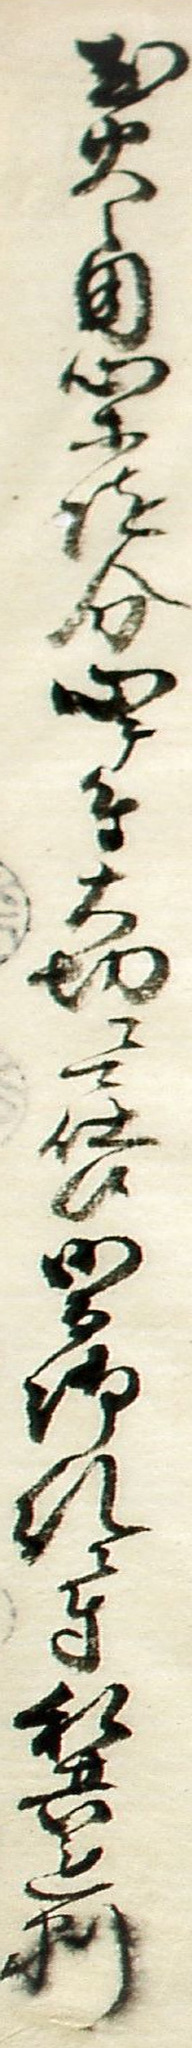尤火之用心等随分心ヲ付大切ニ可仕候仍而御糺ニ付私共連判
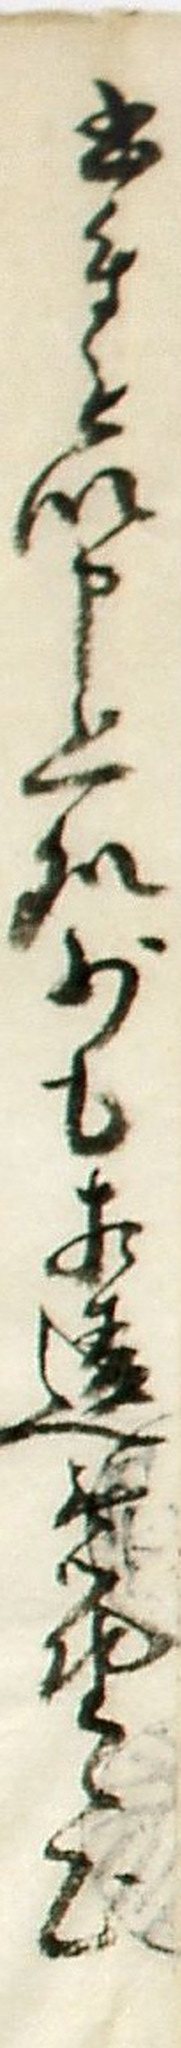書付を以申上処少も相違無御坐候以上

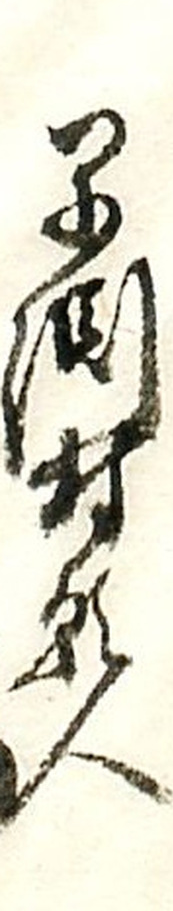早渕村願人
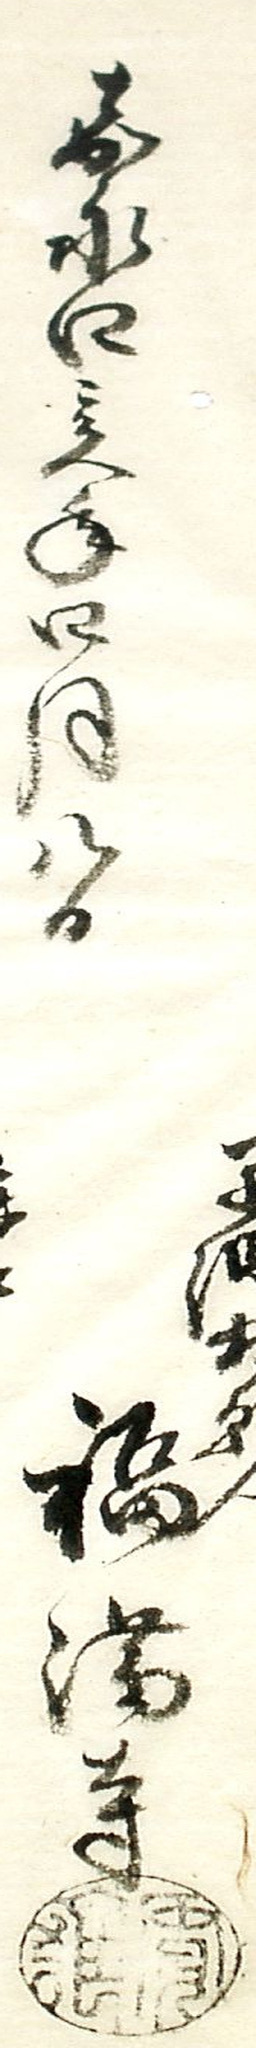嘉永四亥年四月八日福満寺
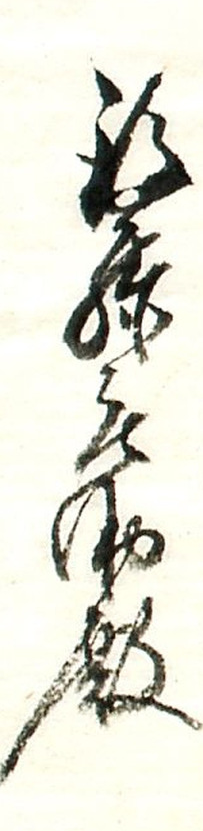後藤庄助殿
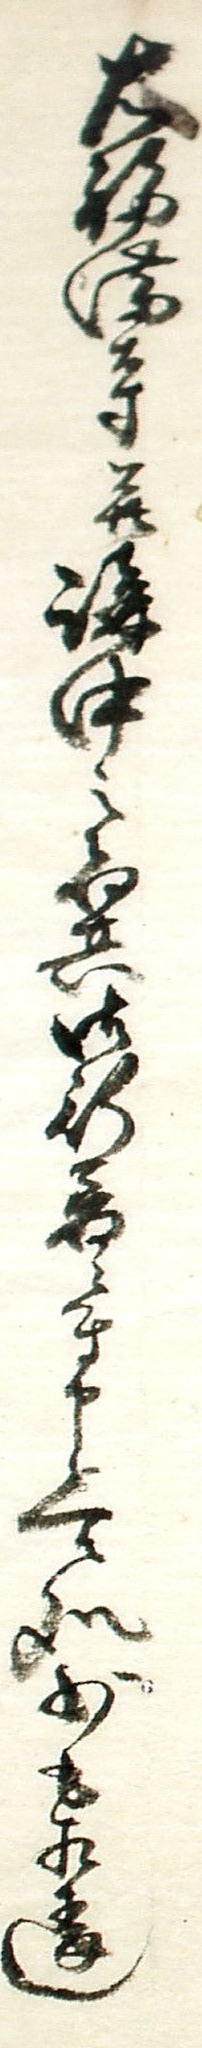右福満寺幷講中之者共御行着ニ付申上候処少も相違
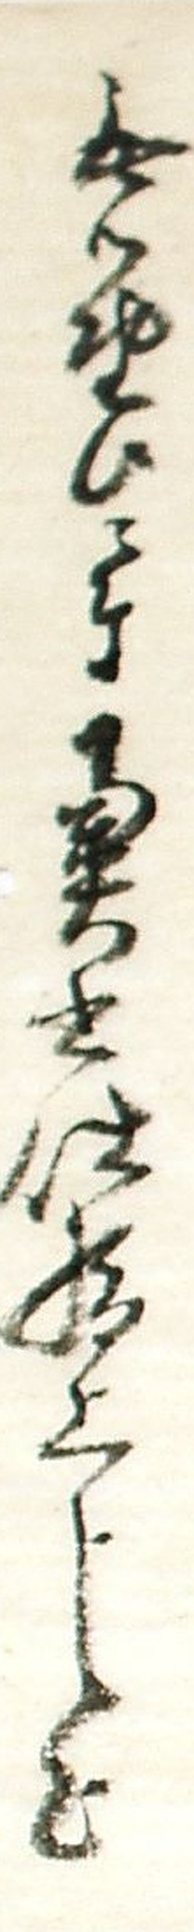無御坐候ニ付奥書仕指上申候以上
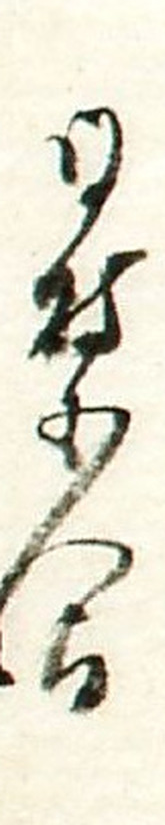同村五人与
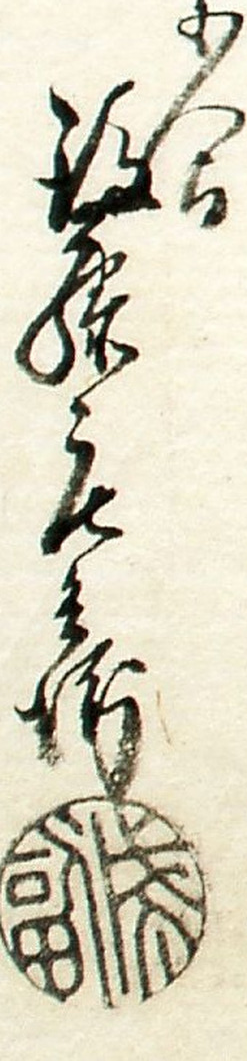後藤庄兵衛
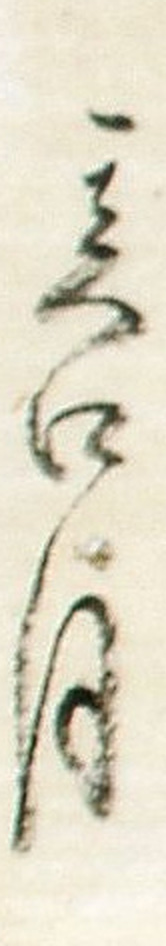亥四月
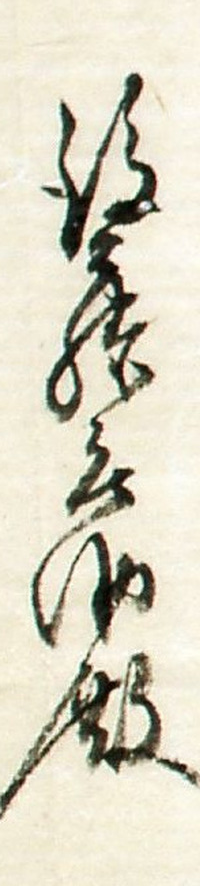後藤庄助殿
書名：(早渕村福満寺子ども浄瑠璃願紙面）他
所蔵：鳴門教育大学 Naruto University of Education
